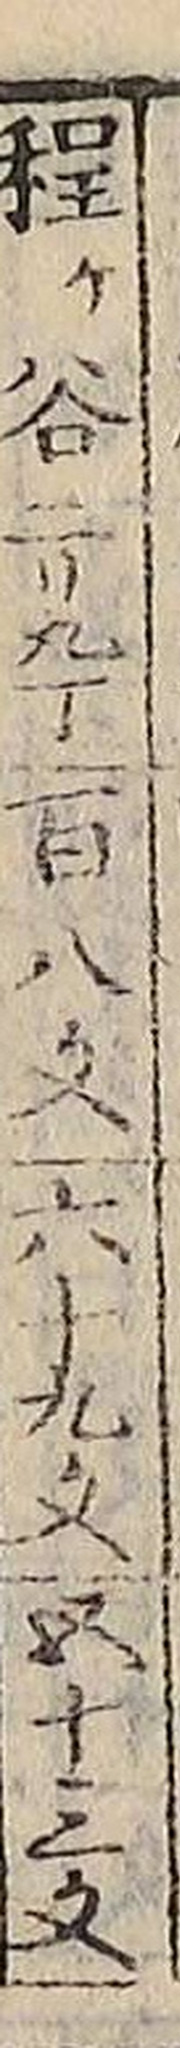程谷二リ九丁百八文六十九文五十三文
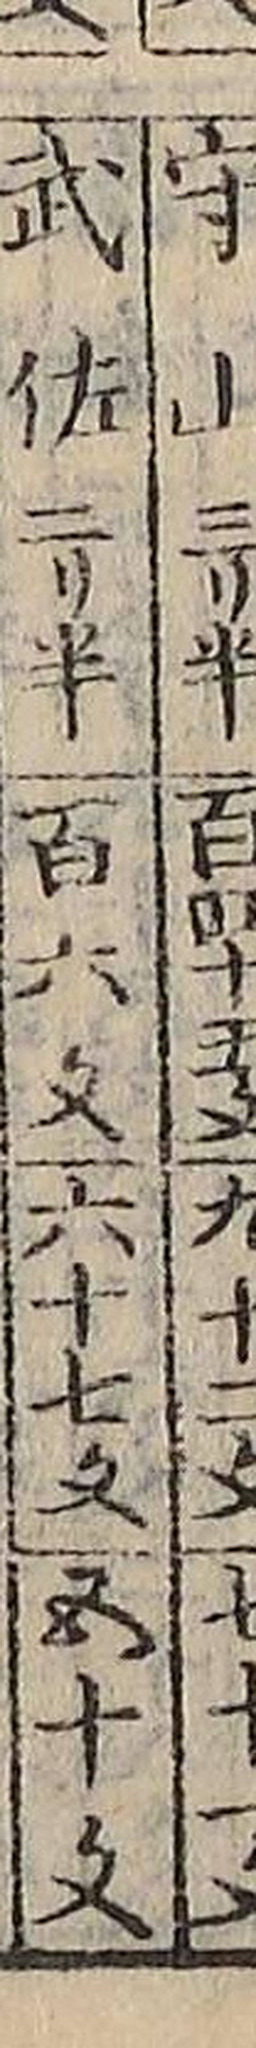武佐二リ半百六文六十七文五十文
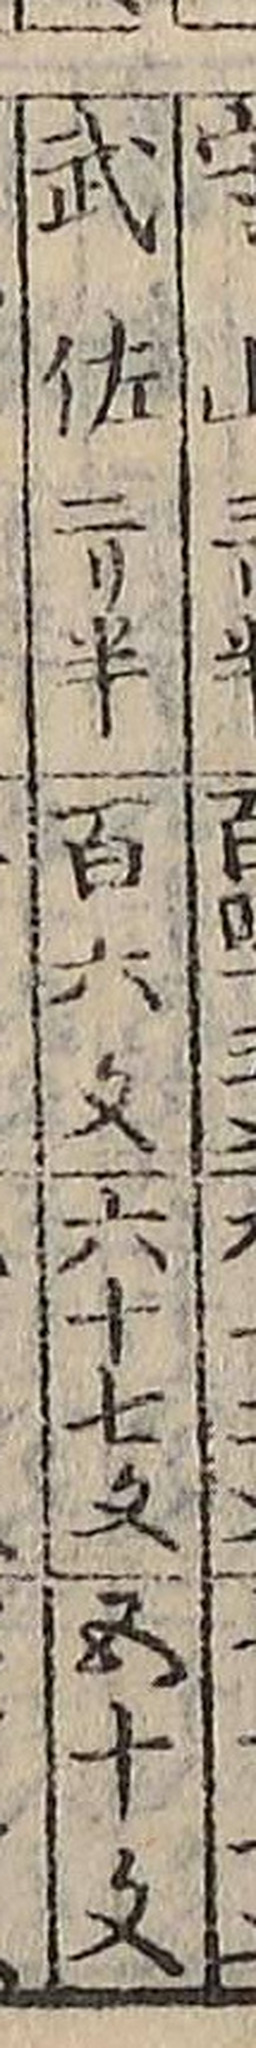武佐二リ半百六文六十七文五十文
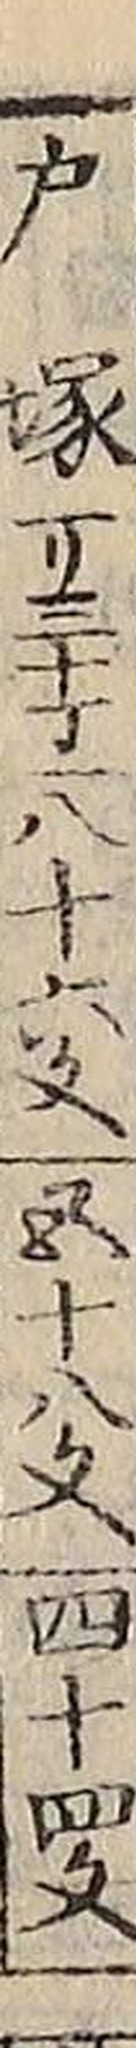戸塚一リ三十丁八十六文五十八文四十四文
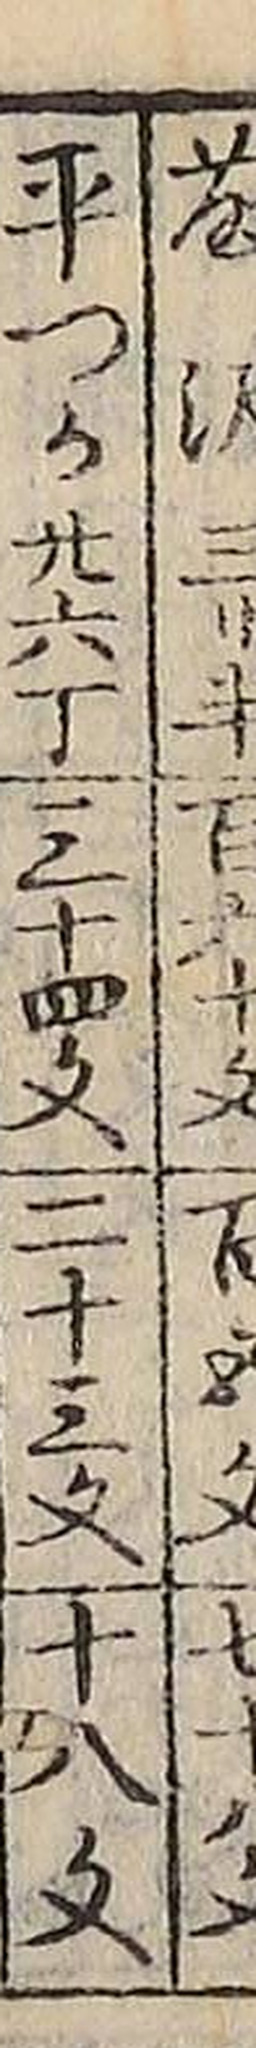平つか廿六丁三十四文二十三文十八文
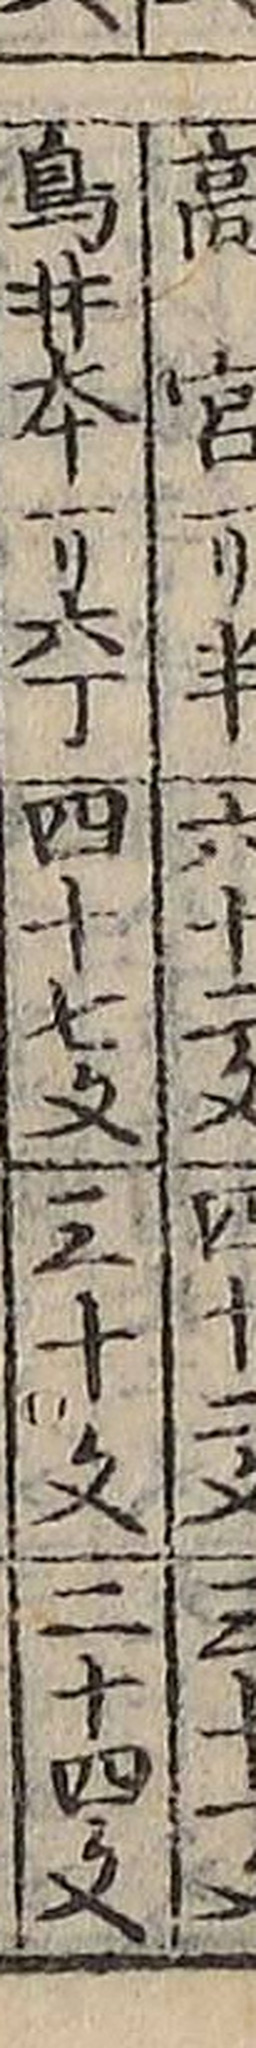鳥井本一リ六丁四十七文三十文二十四文
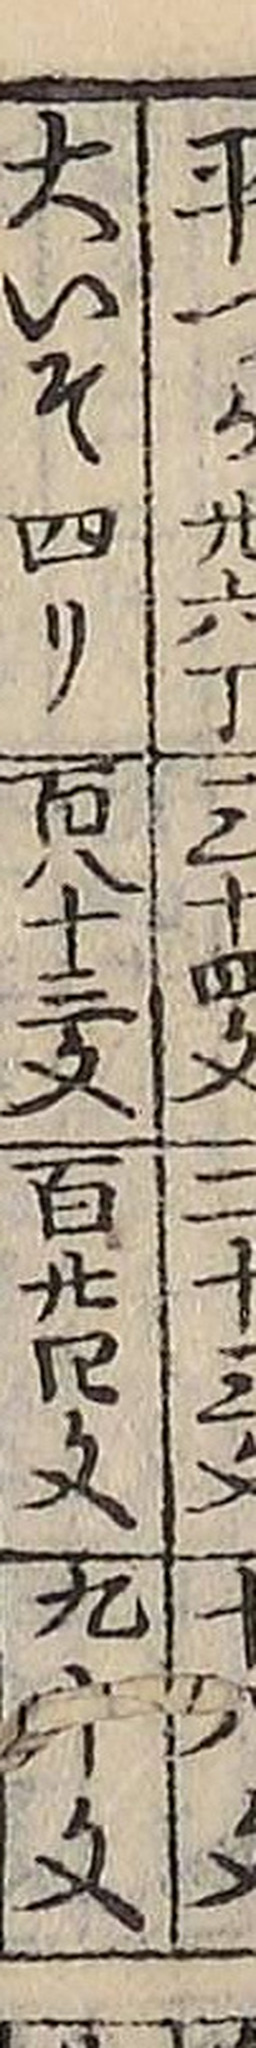大いそ四リ百八十三文百廿四文九文
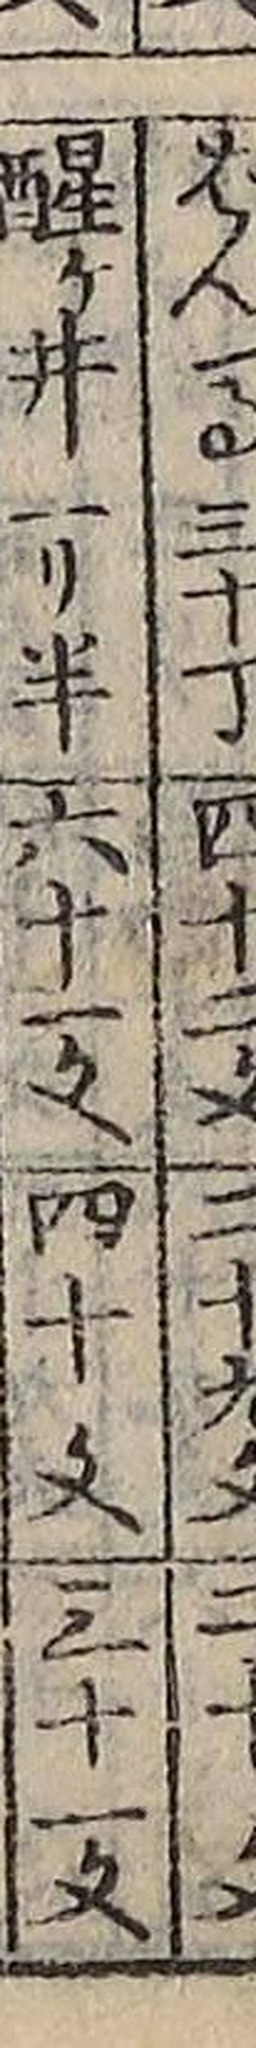草津一リ半六十一文四十文三十一文
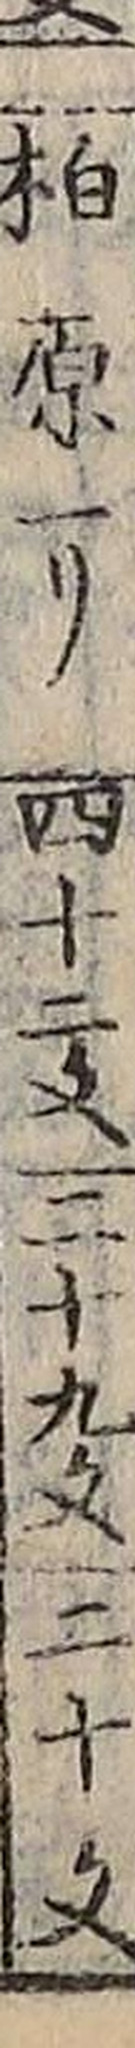柏原一リ四十二文二十九文二十文
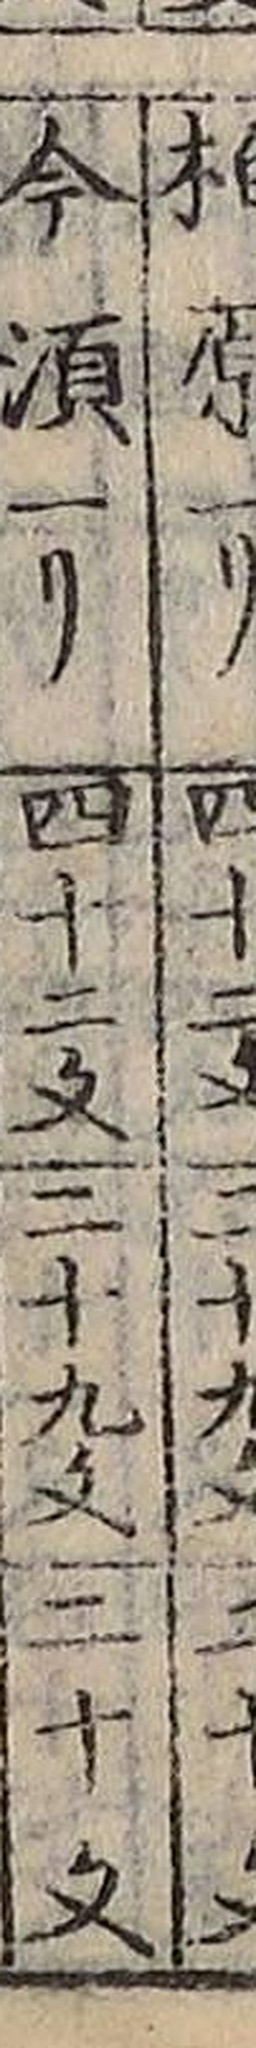今須一リ四十二文二十九文二十文
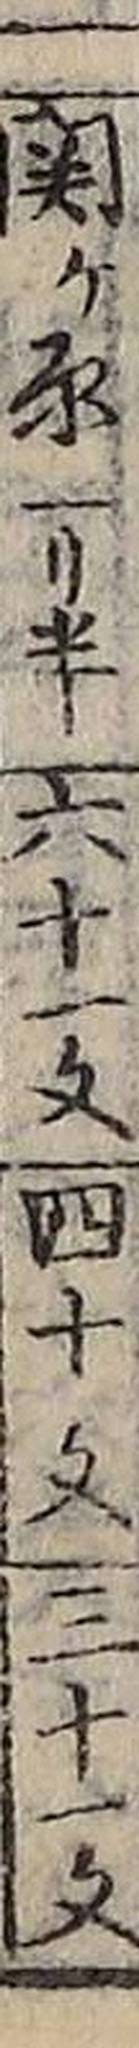関ケ原一リ半六十一文四十文三十一文
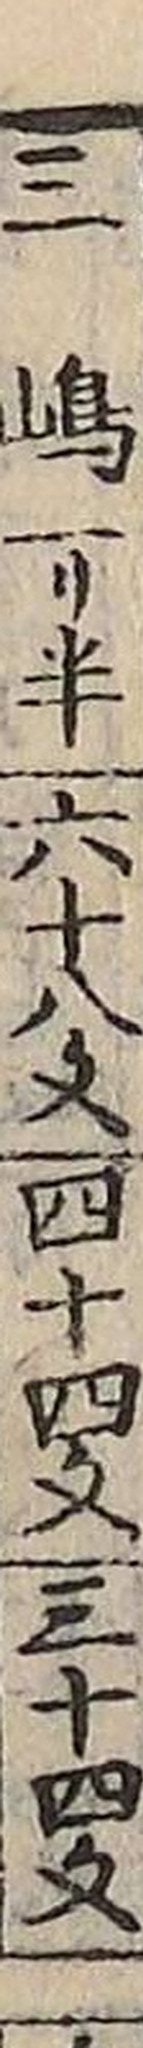三島一リ半六十八文四十四文三十四文
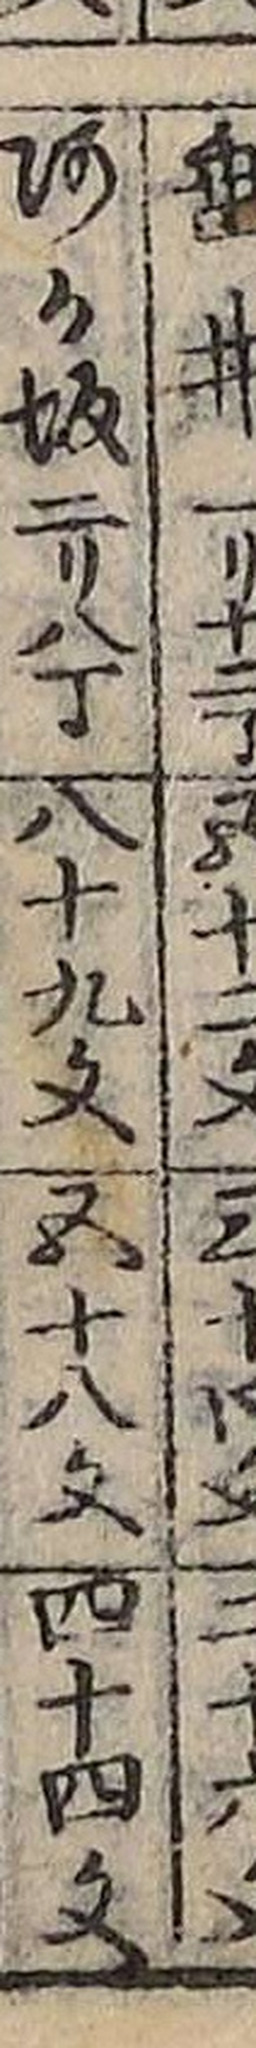あか坂二リ八丁八十九文五十八文四十四文

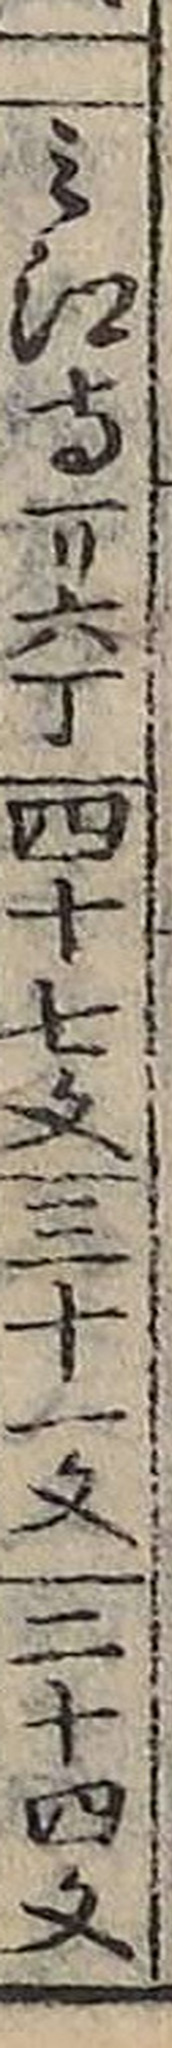みえ寺一リ六丁四十七文三十一文二十四文
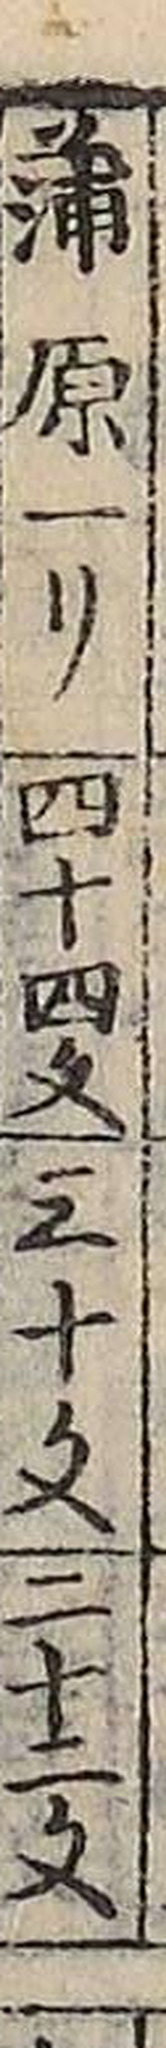蒲原一リ四十四文三十文二十二文
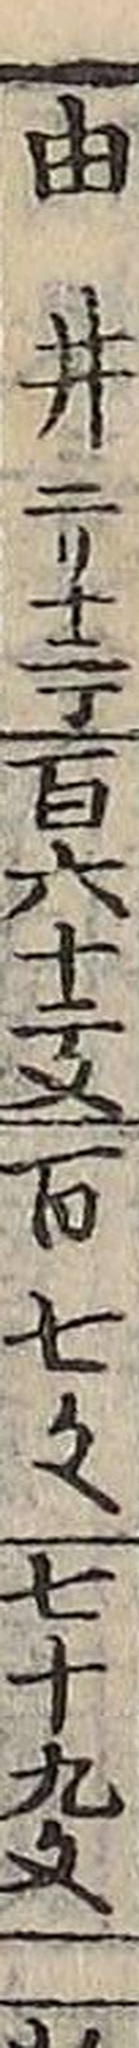由井二リ十二丁百六十二文百七文七十九文
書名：旅行用心集
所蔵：神戸大学附属図書館 国文学研究資料館
